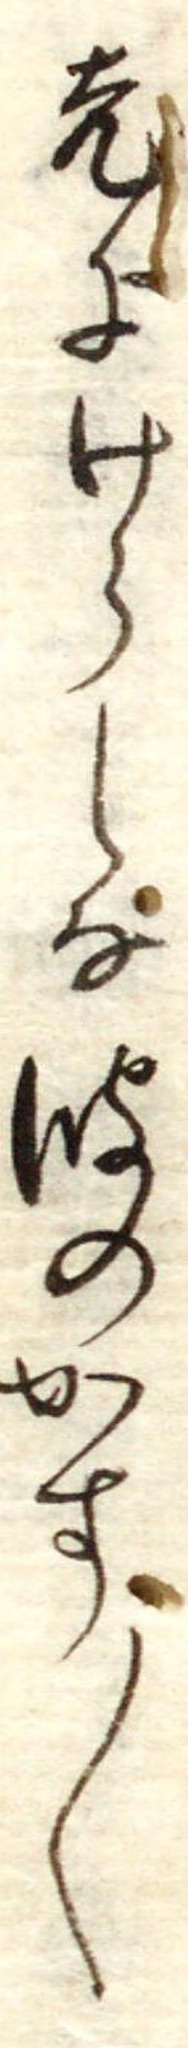老にけらしな波のかす〳〵
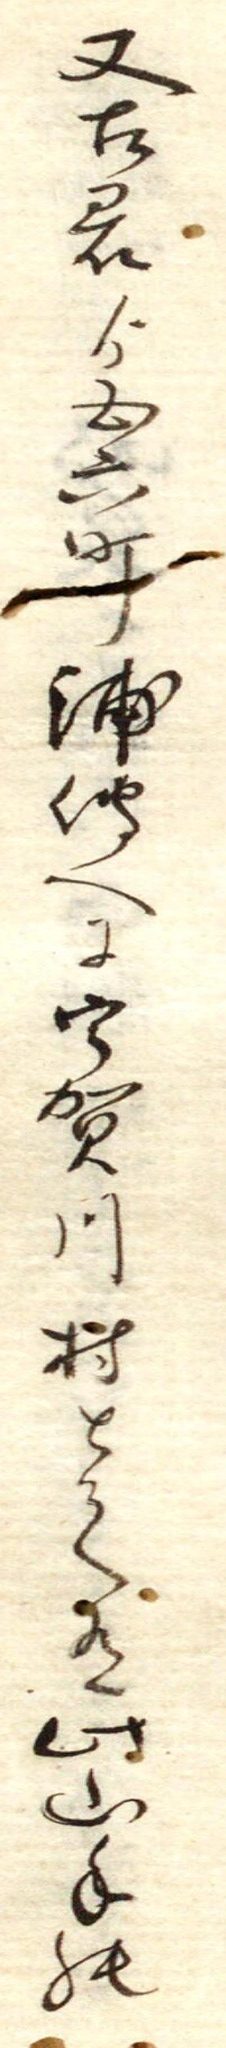又古君ゟ五六町浦伝へに宇賀川村とて有此山手の

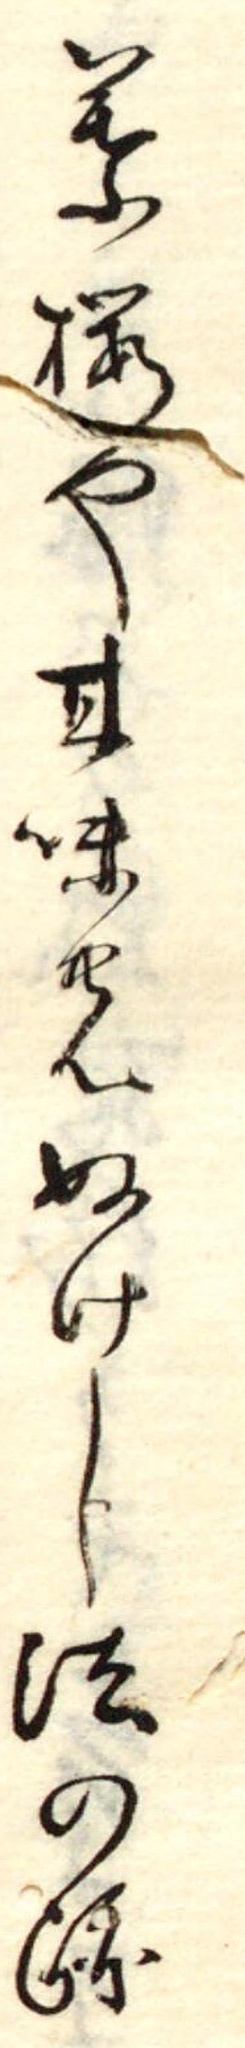葉桜や甘味のぬけし法の跡
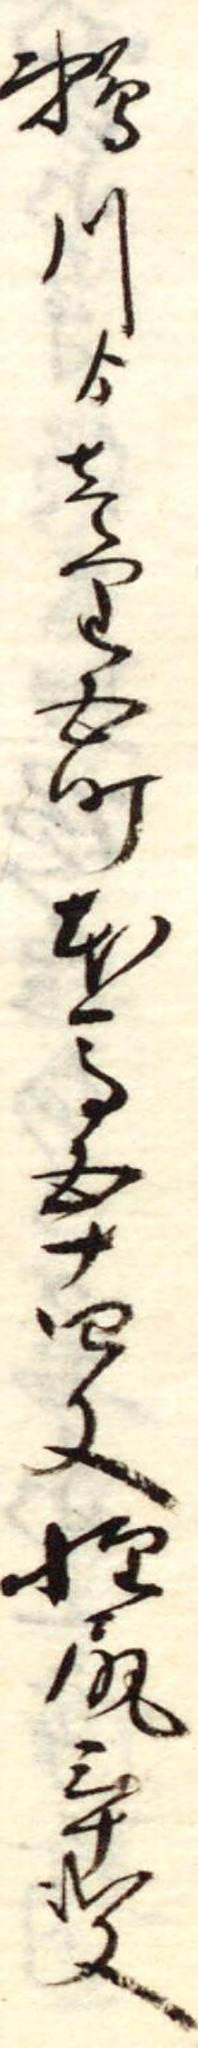鵜川ゟ壱里五町本馬五十四文軽尻三十弐文
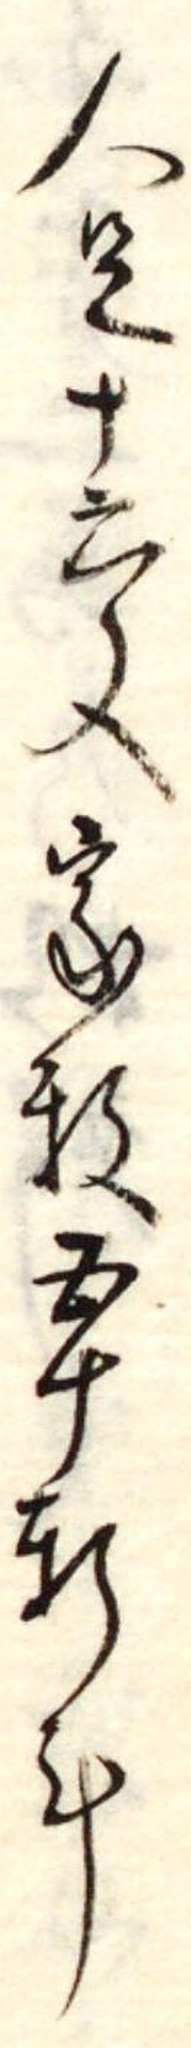人足十六文家数五十軒斗
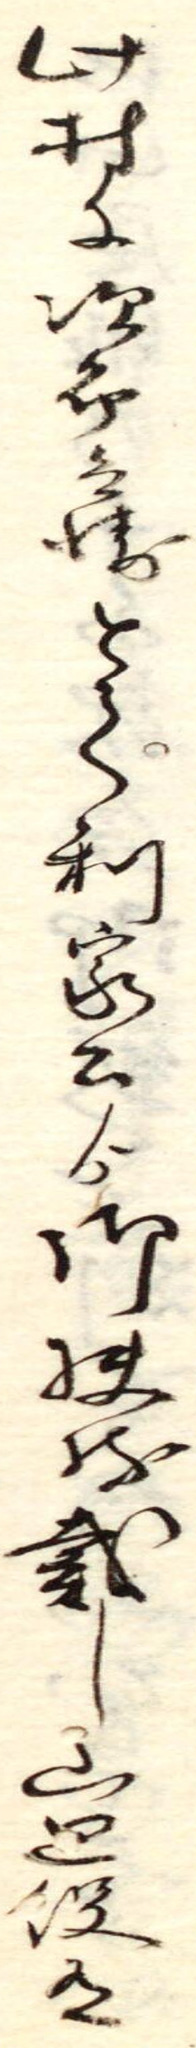此村に次郎兵衛とて利家公ゟ御扶持戴し山廻役有
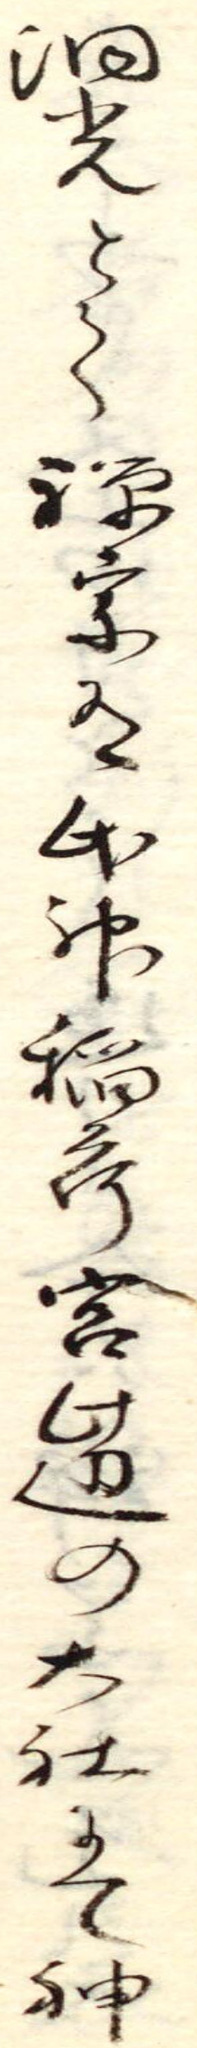洞光とて禅宗有氏神稲荷宮此辺の大社にて神
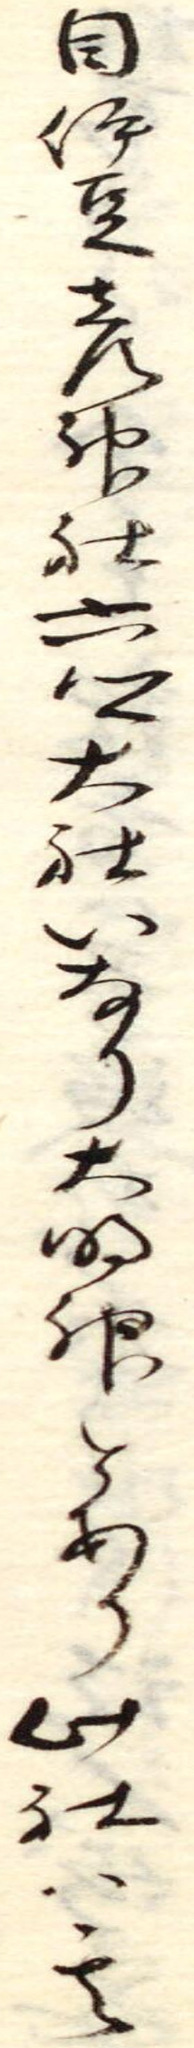目伊豆彦神社六郷大社いなり大明神とあり此社は其
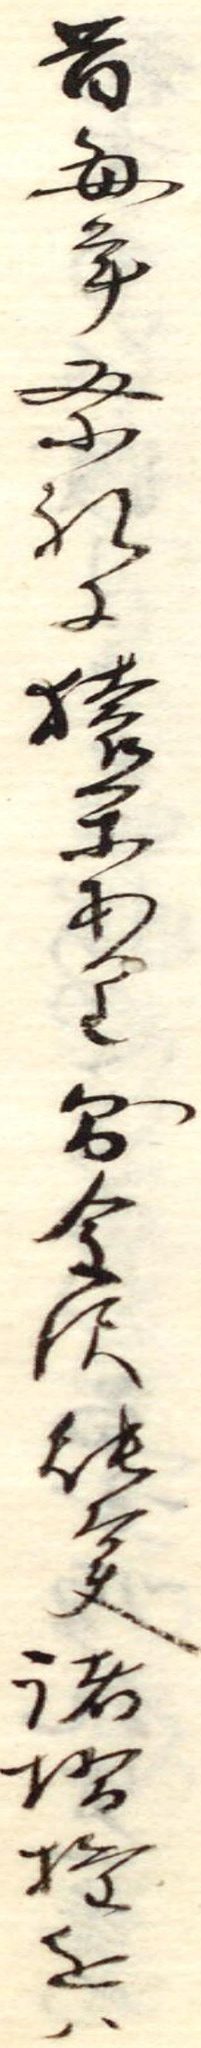昔毎年祭礼に猿楽あり則金沢能太夫諸橋権進は
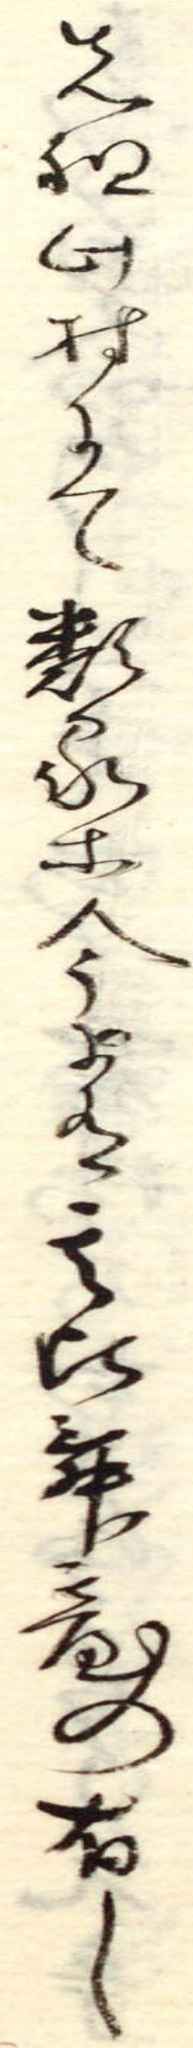先祖此村にて類家等今に有其比舞台の有し
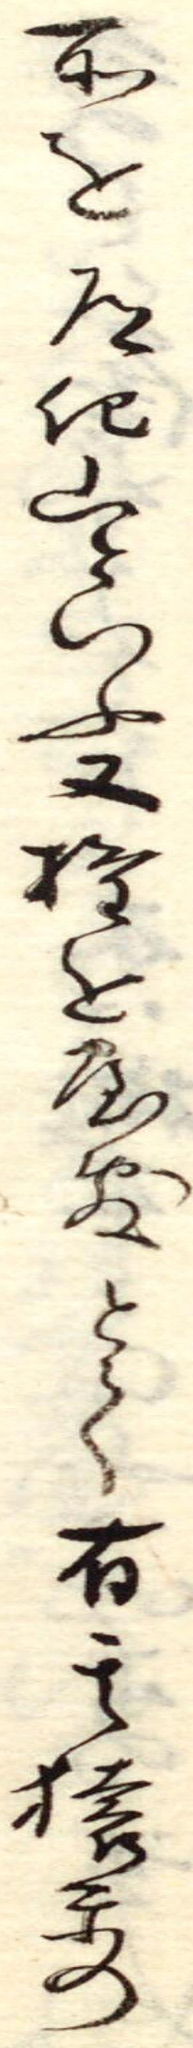所を道化山といふ又権進屋敷とて有其猿楽の
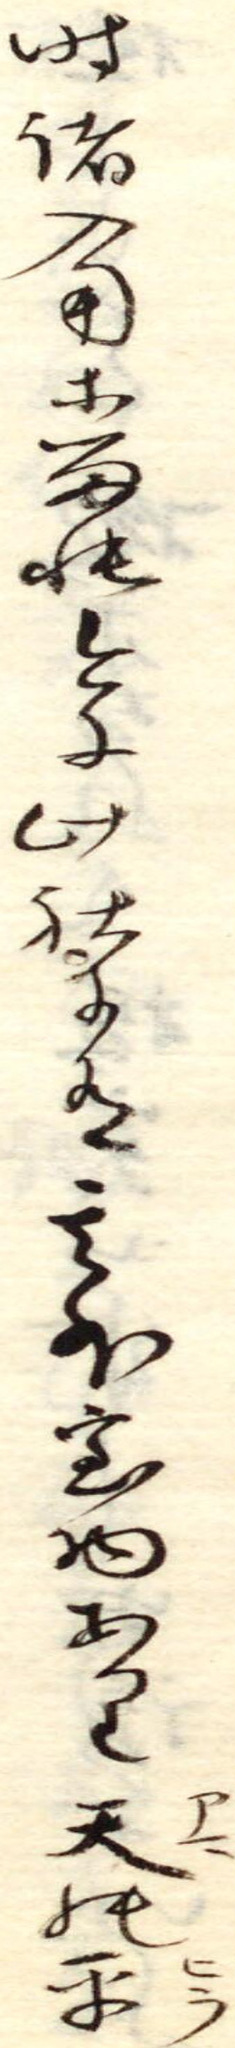時諸入用等留帳今に此社に有其外ほ宝物あり天の平
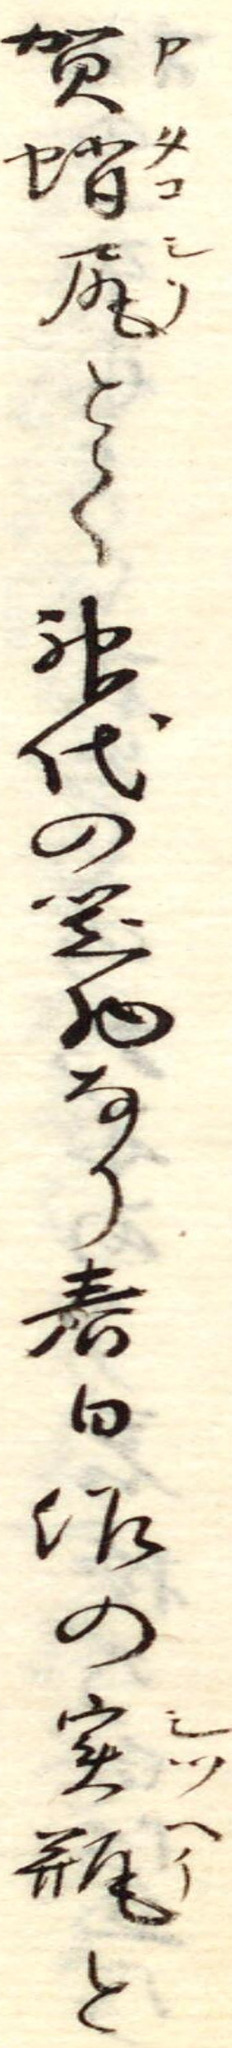賀蛸尻とて神代の宝物なり春日作の実瓶と
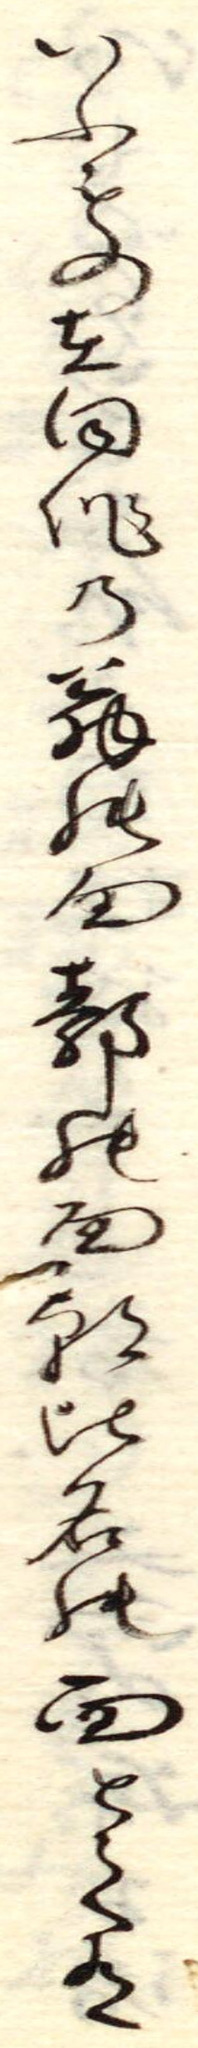いふもの在国作の翁の面静の面朝比名の面とて有
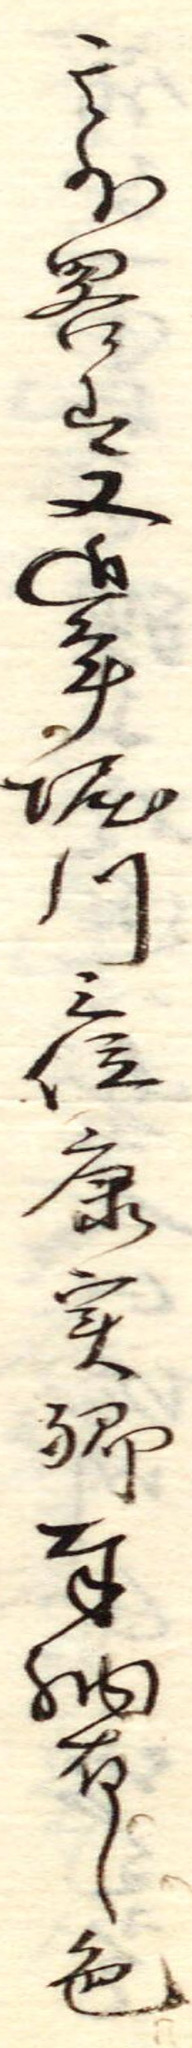其外略す又近年堀川三位康実卿奉納有し色
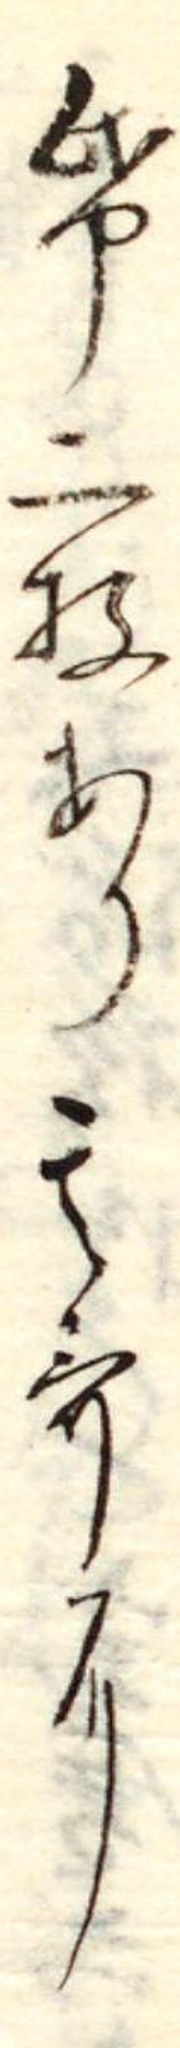帋二枚あり其哥に
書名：能登名跡誌
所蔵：Ishikawa Prefectural Library
